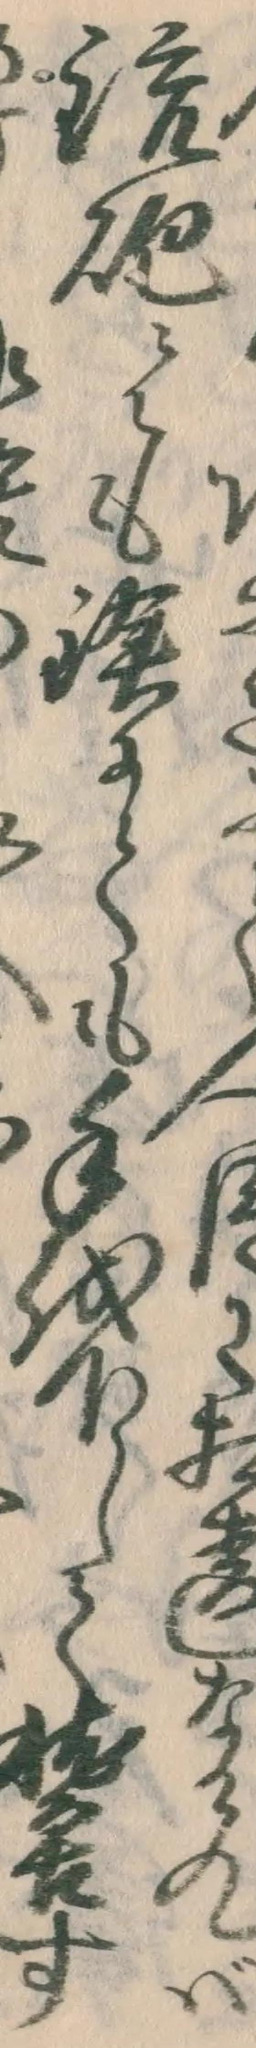銃砲ニても鎗にても手を下して稽古す
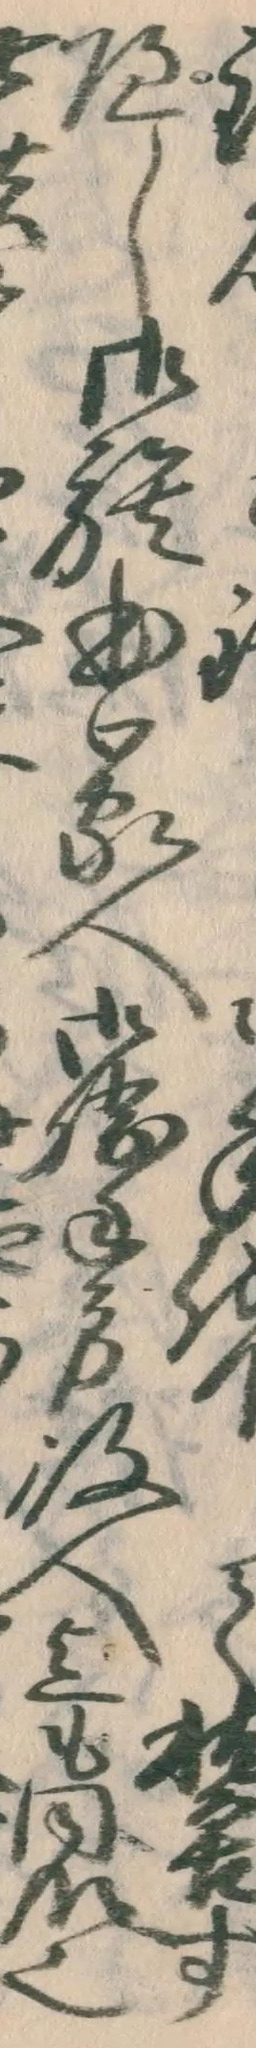へし御旗本御家人御勝手方役人迄も同様也
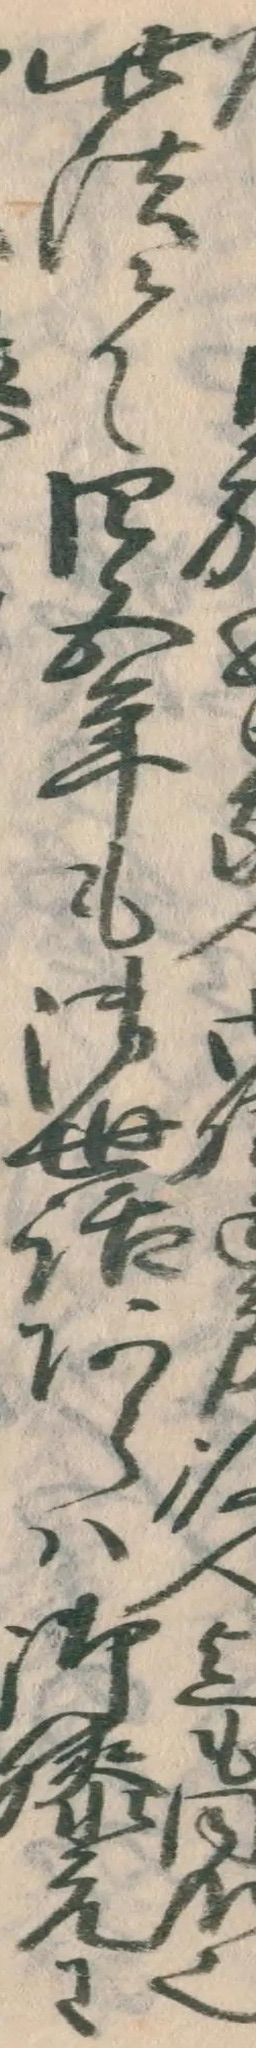此法ニて四五年も御世話あらハ御膝元に
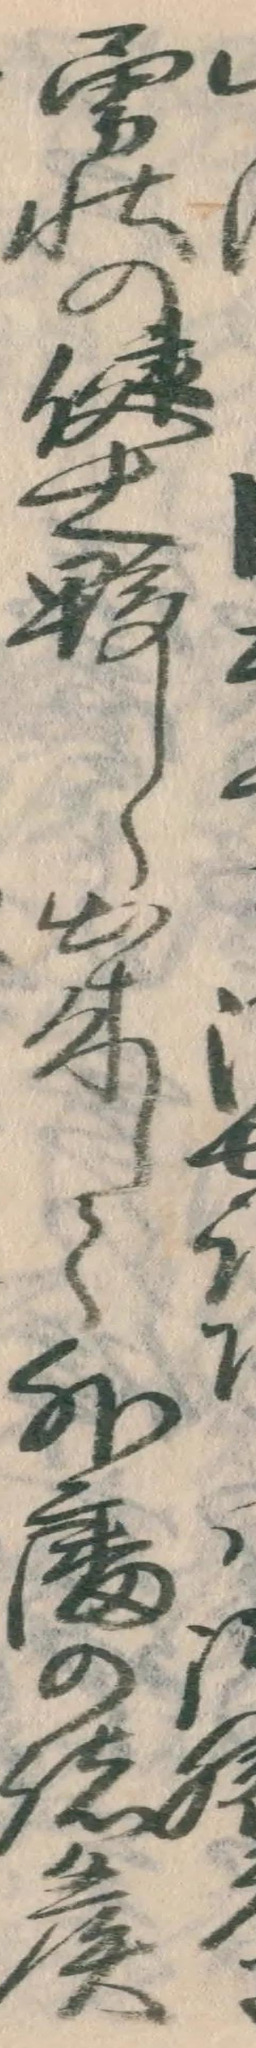勇壮の健士夥しく出来して外藩の諸侯
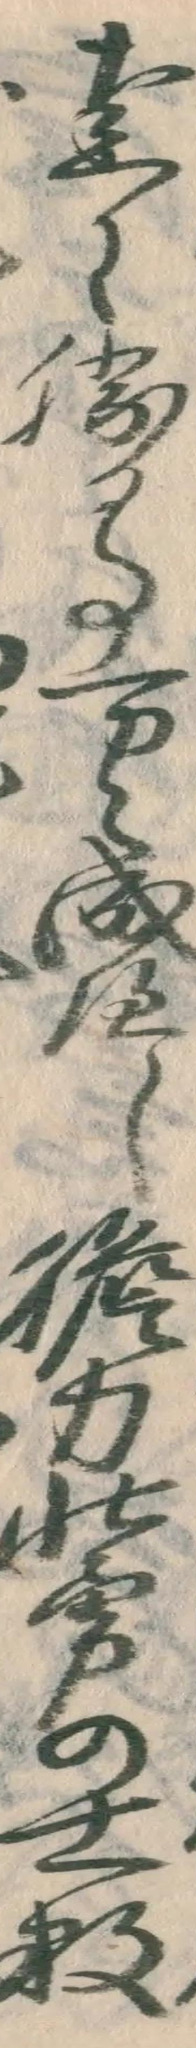達に勝る事万々成へし膽力壮勇の士数
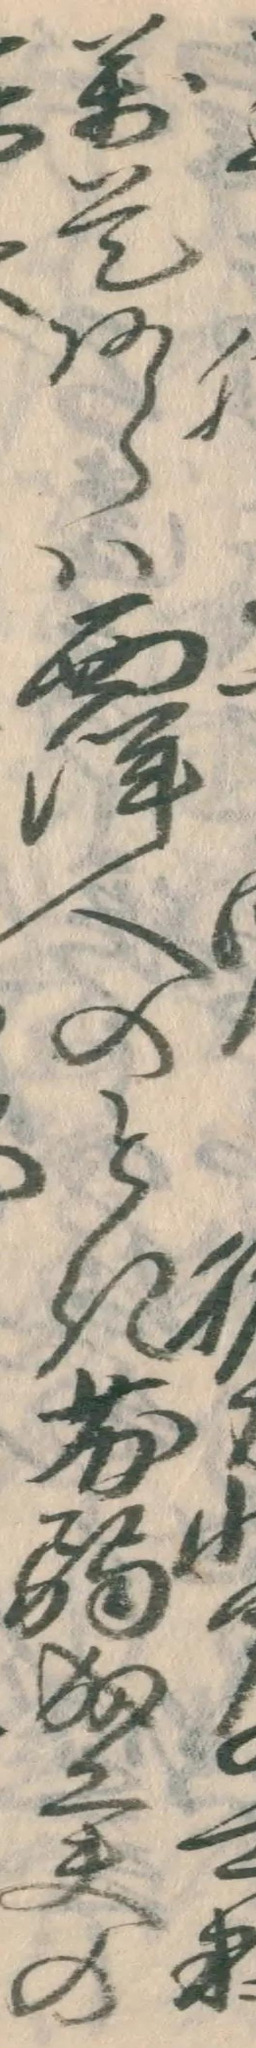萬是あらハ西洋人のことき劣弱成工夫の
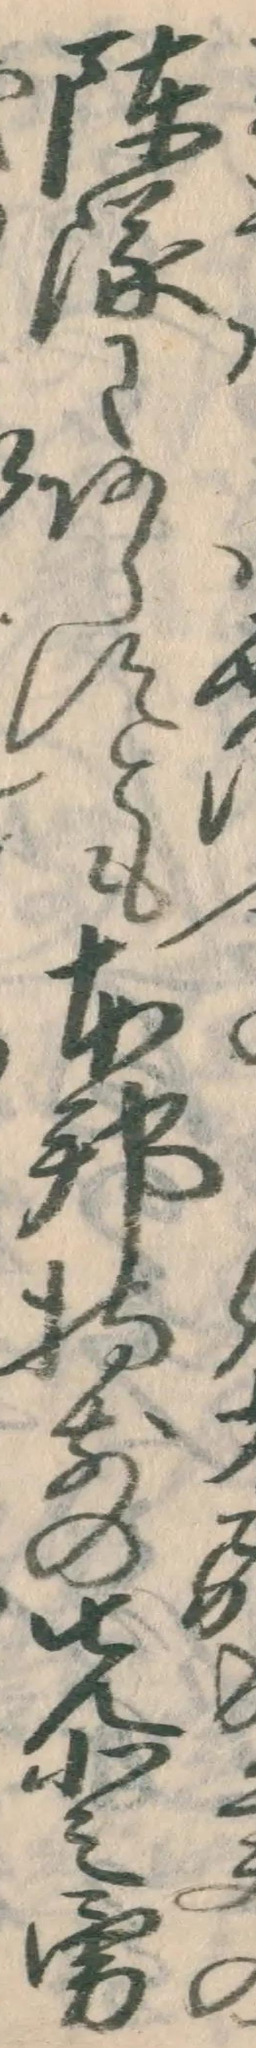陣隊にあらすとも本邦持前の先登勇
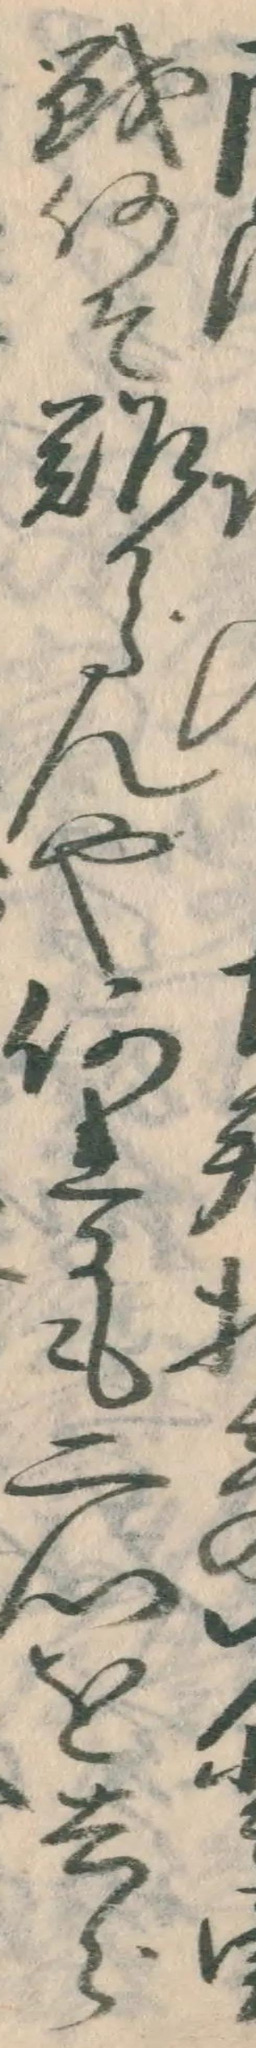戦何そ難からんや何れにも二心を去ら
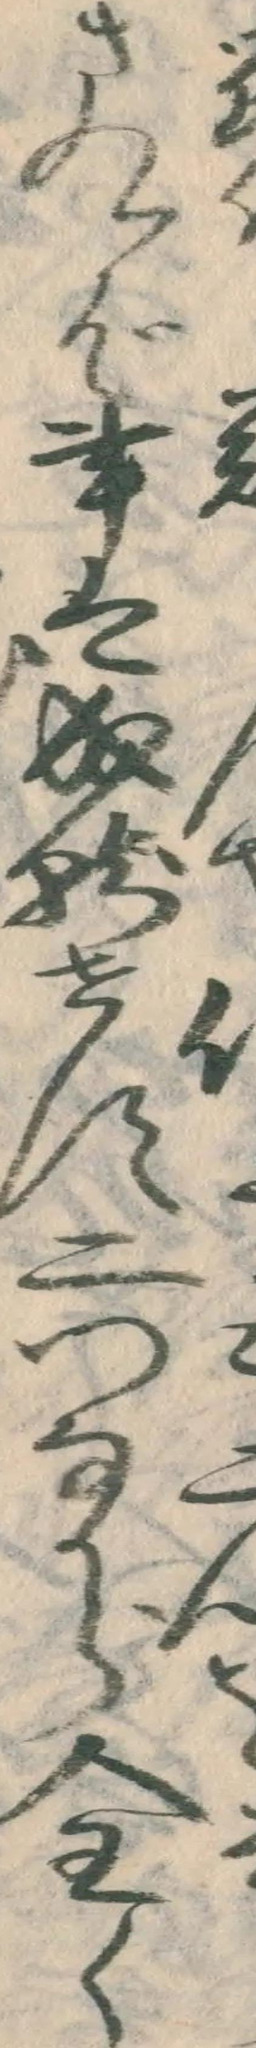されば事は成就せす二ツなから全く
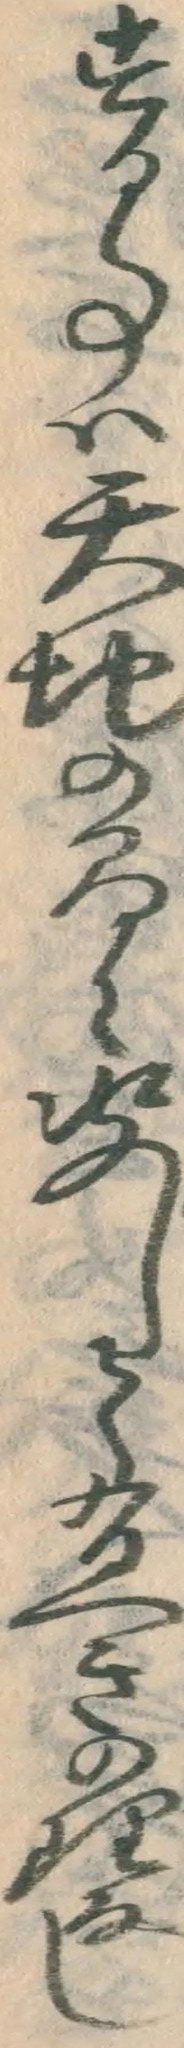する事ハ天地の間に決して有へきの理なし

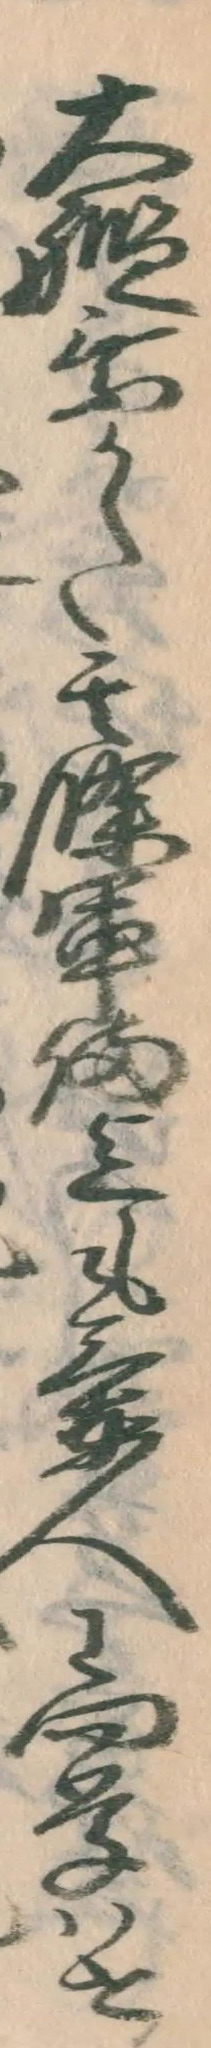一大艦乗かた其餘軍備迄も蘭人に向学ハせ
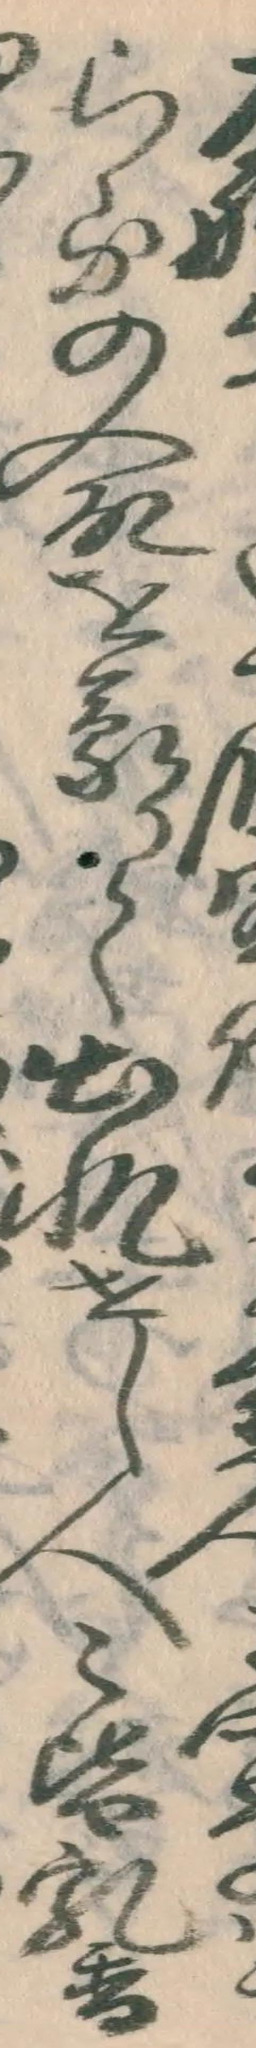らるの命を蒙りて出帆せし人々皆乳香
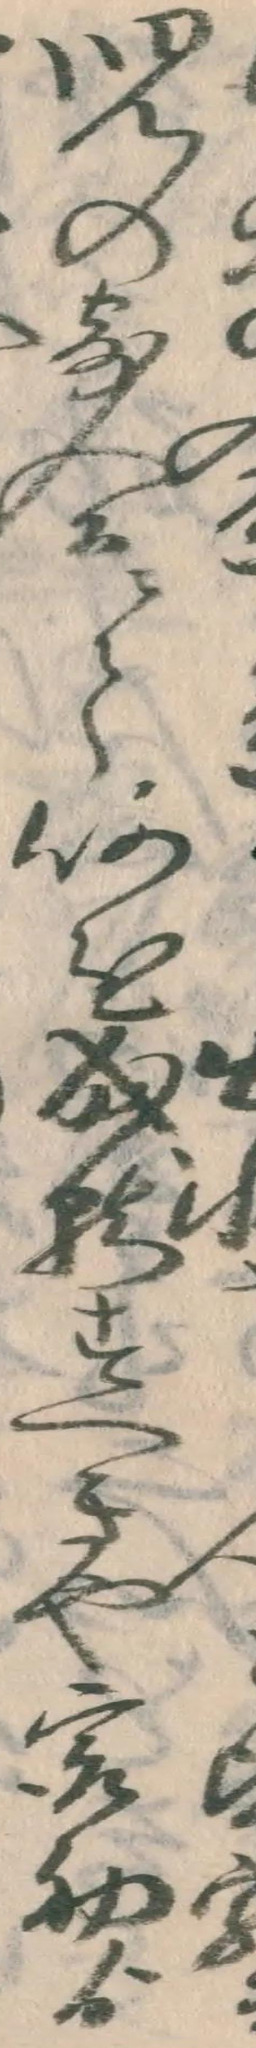児の寄合ニて何を成就すへきや最初ゟ
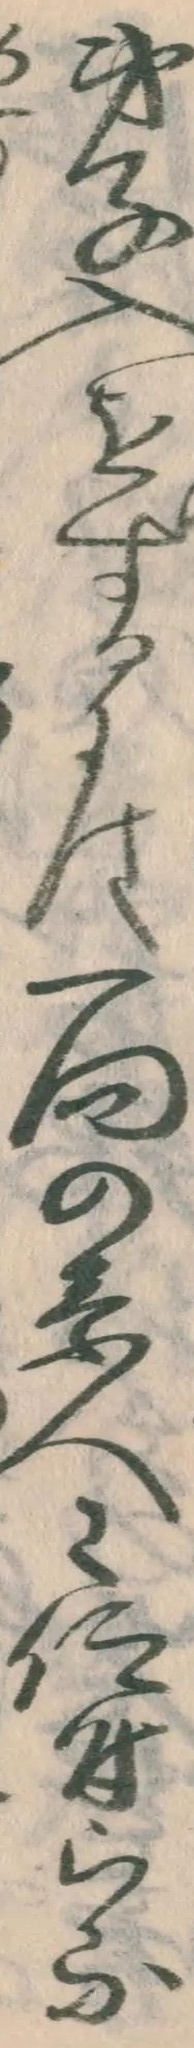弟子入をするには一向の素人に仰付らる
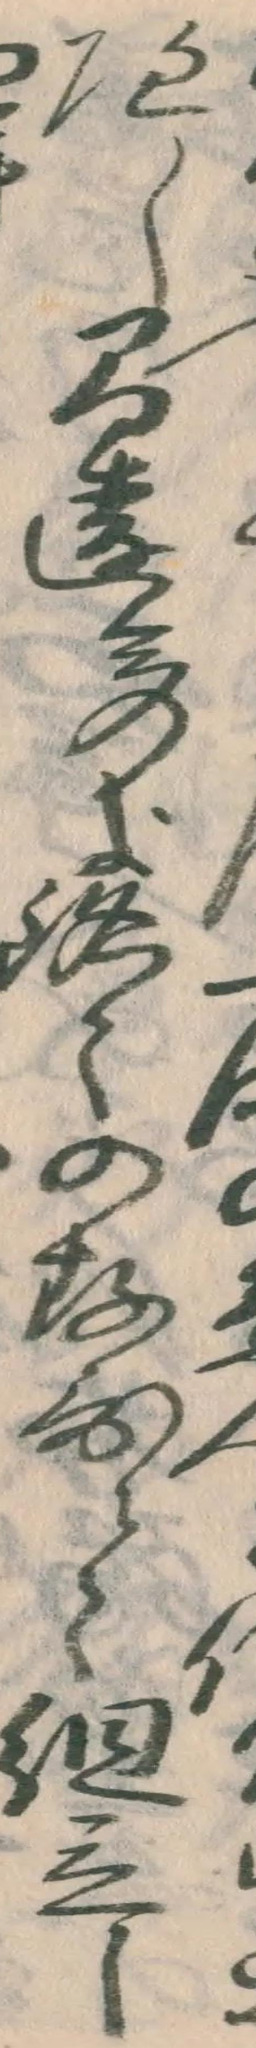へし間違多き銘々の存寄ニて組立し
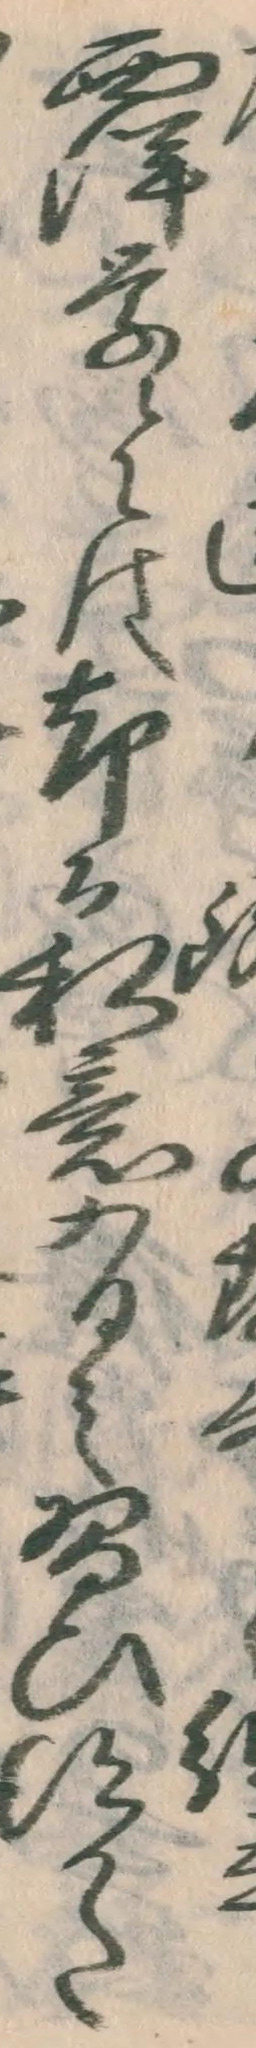西洋学ニては却而私意有之習ひ得かた
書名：麗斎叢書. 20
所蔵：国立国会図書館 National Diet Library, JAPAN
